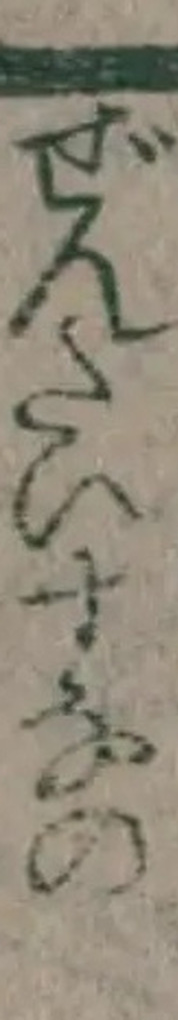ぜんたいすなの
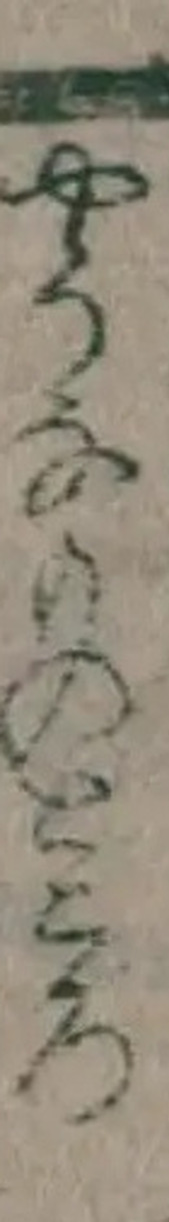やうなものところ
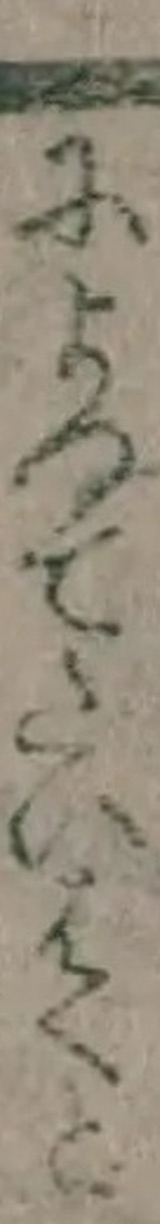によつてたいはくと
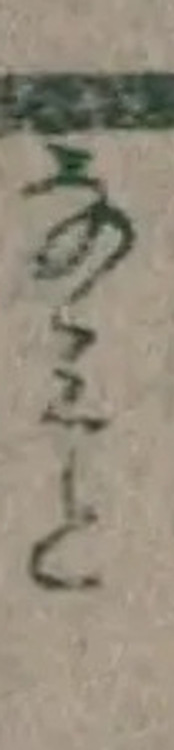なみと
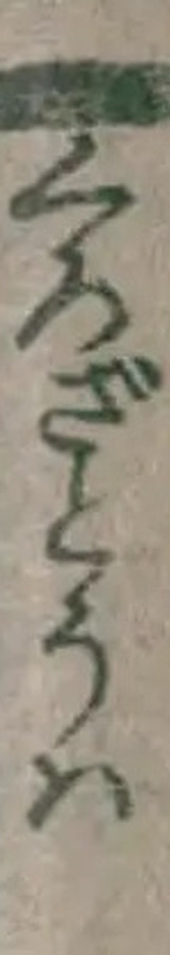くろざとうは
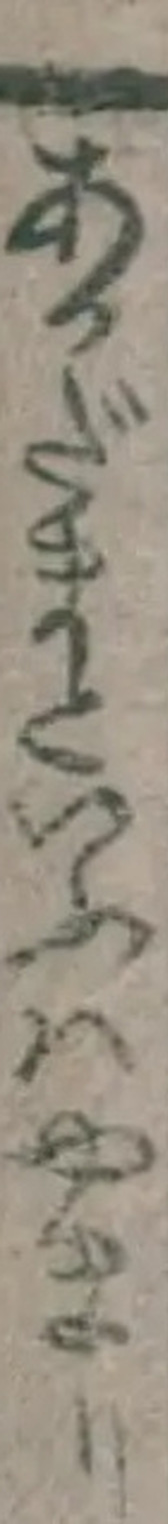あかだまといふはやま
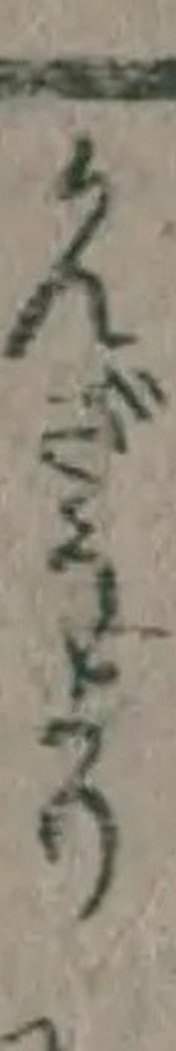かんざうより
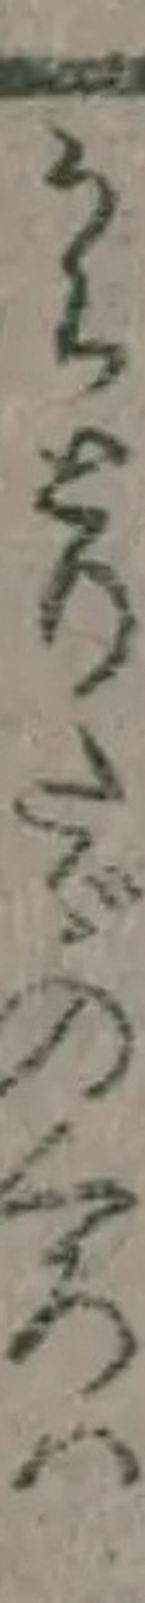からとりたゞのくろは
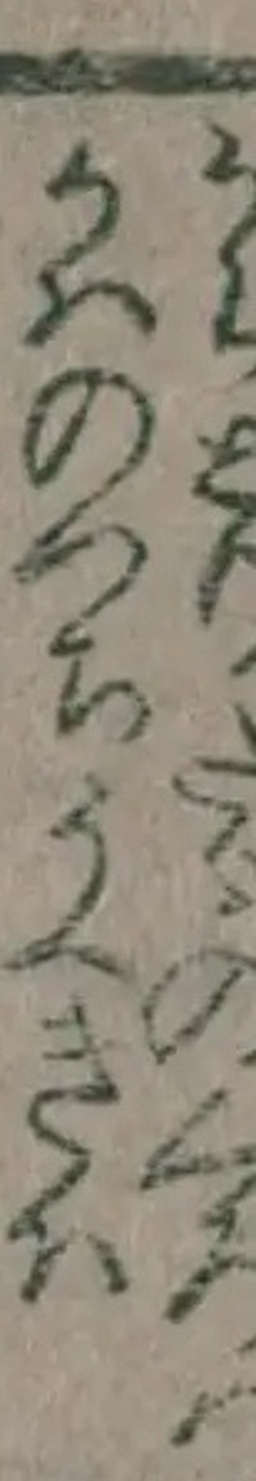かはのつちうへきは
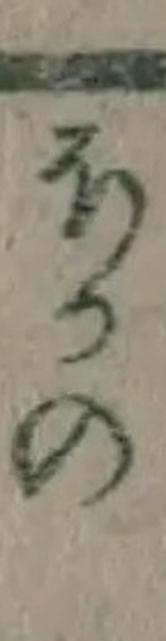ほかの
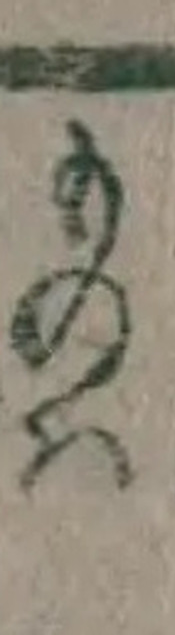ものは
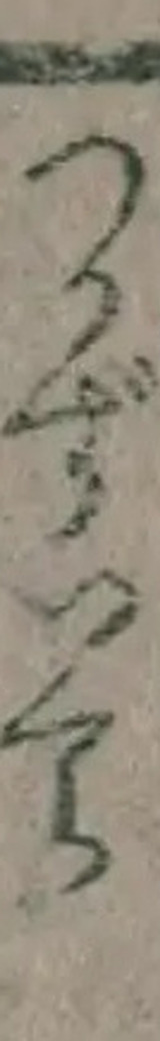つかずいくら
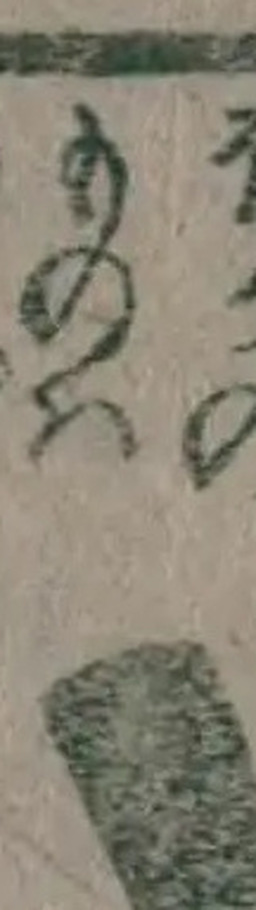ものは
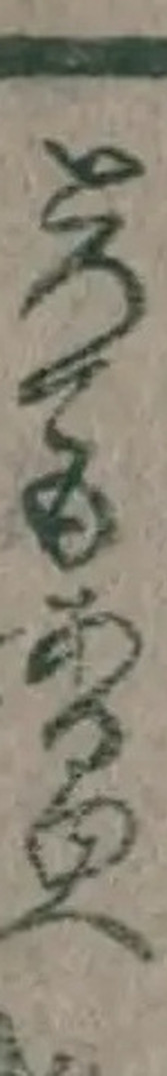とつてもあるゆへ
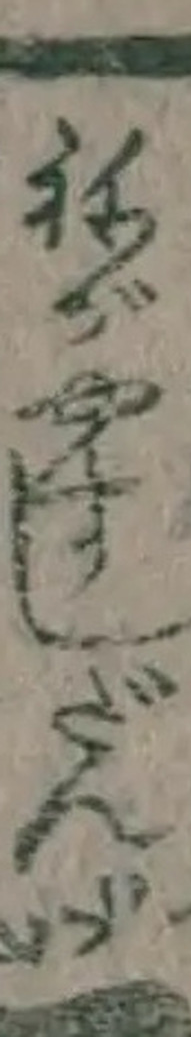ねがやすしだん
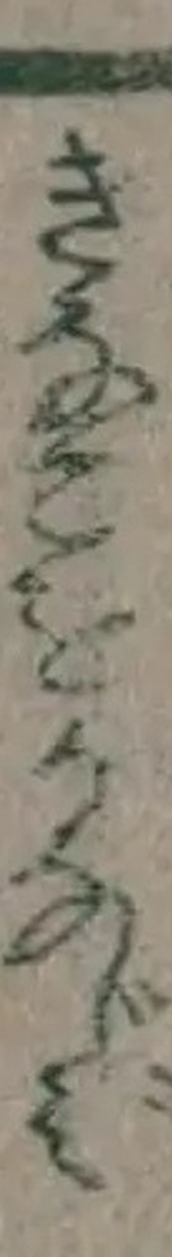きなこをかなしみ
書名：縦筒放唐の噺 3巻
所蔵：国立国会図書館 National Diet Library, JAPAN
